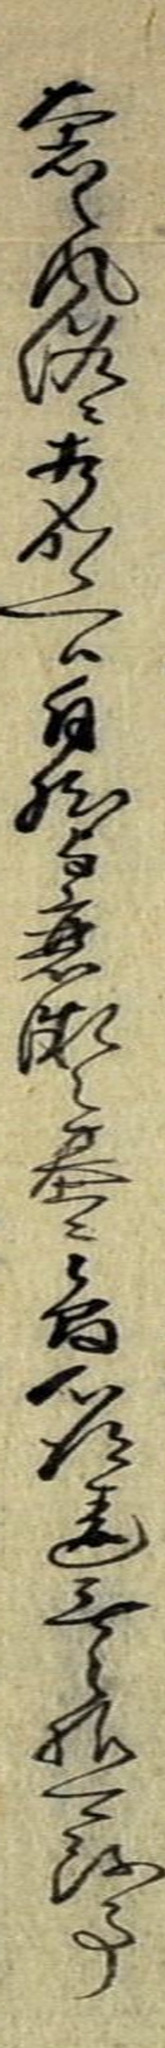奢之風俗ニ相成候ヘハ自然与衰微之基ニ候間心得違無之様可致事
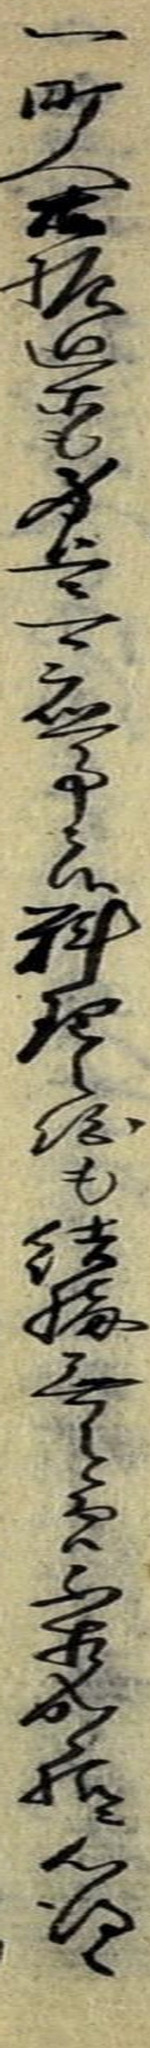一町人共振廻等も身上ニ可応事ニ候料理之儀も結構無之候而ハ不相成候様ニ心得候
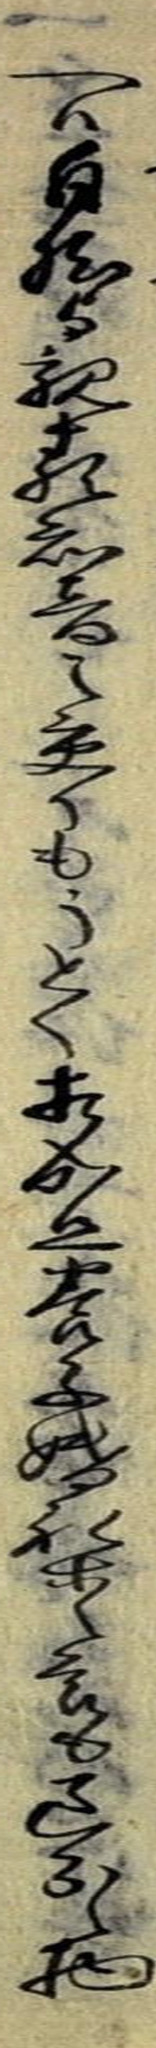ヘハ自然与親類知音之交りもうとく相成且養子婚礼等之節も過分之物
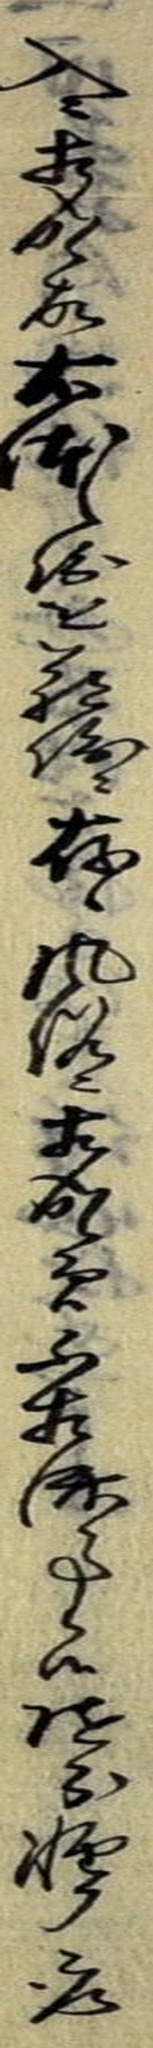入ニ相成候故右体之儀を難儀ニ存候風俗ニ相成候而ハ不相済事ニ候随分軽ク取
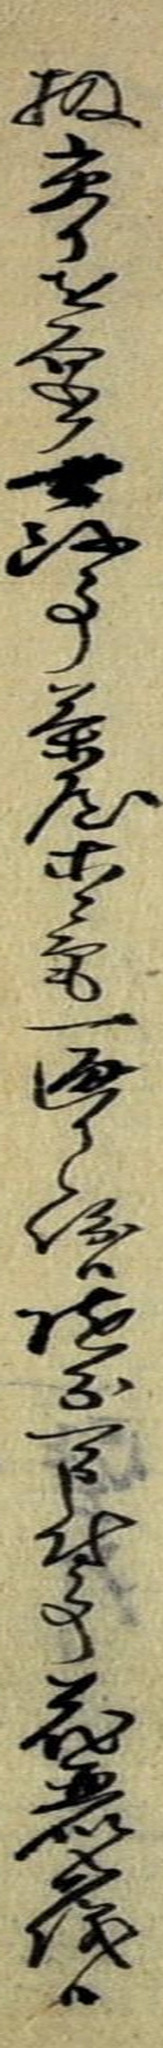扱交りを厚ク可致事茶屋等ニ而も一通り之儀ハ随分可申付事花麗成儀ハ
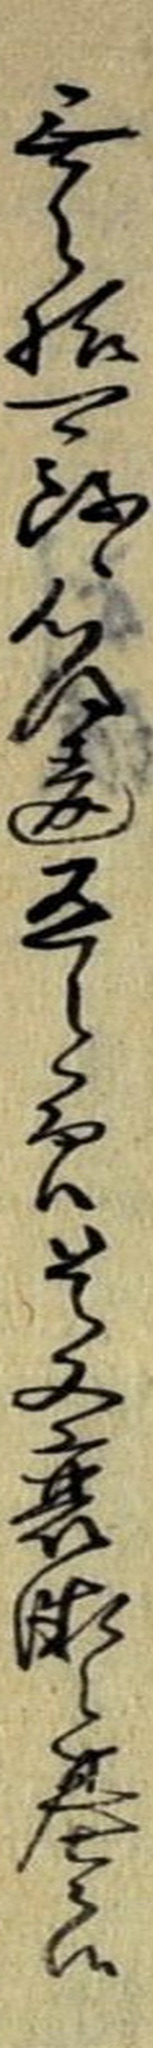無之様可致候心得違有之候而ハ是又衰微之基ニ候
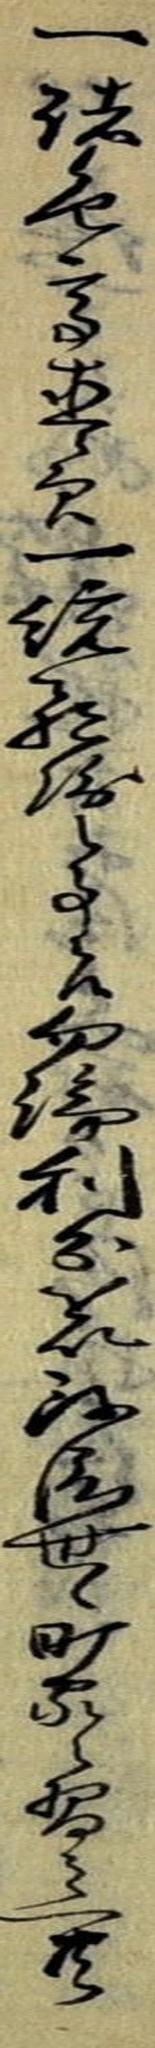一諸色高直ニ而ハ一統難儀之事ニ候勿論利分を以致渡世候町家之習ニ候ヘ共
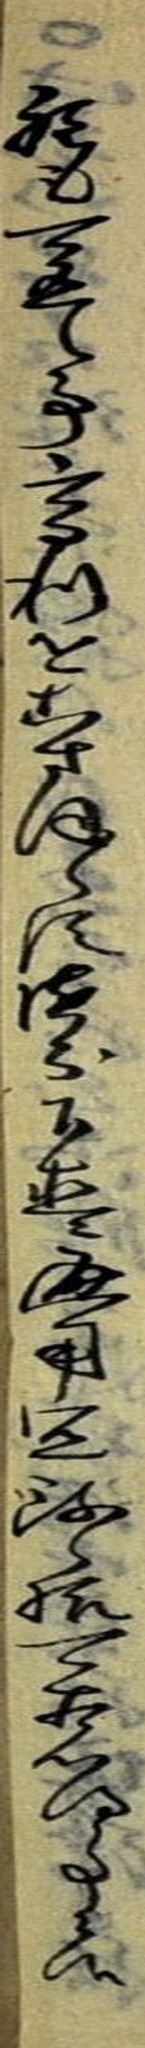程も可有之事高利をむさほらす随分下直ニ通用宜致候様可相心得事ニ候
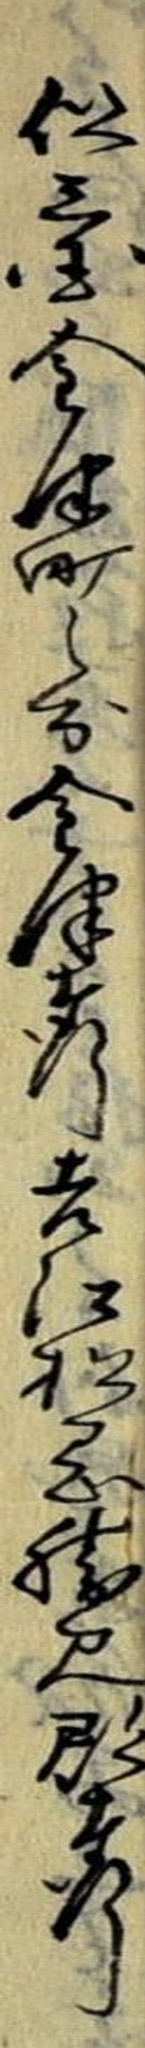但三国金津町之分金津奉行吉江松岡勝見郡奉行
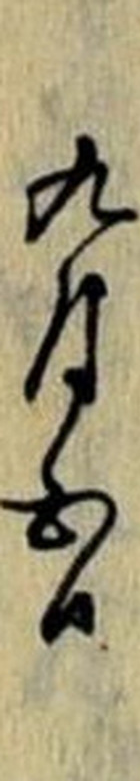九月五日
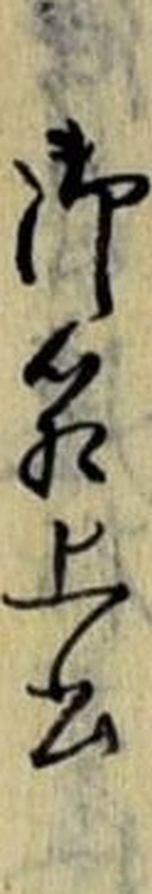御箱上書
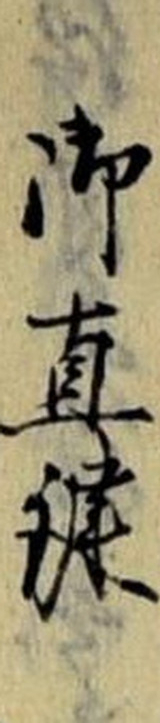御直鍵
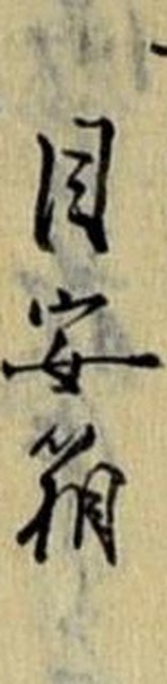目安箱
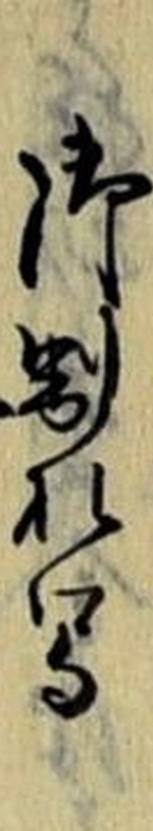御制札写
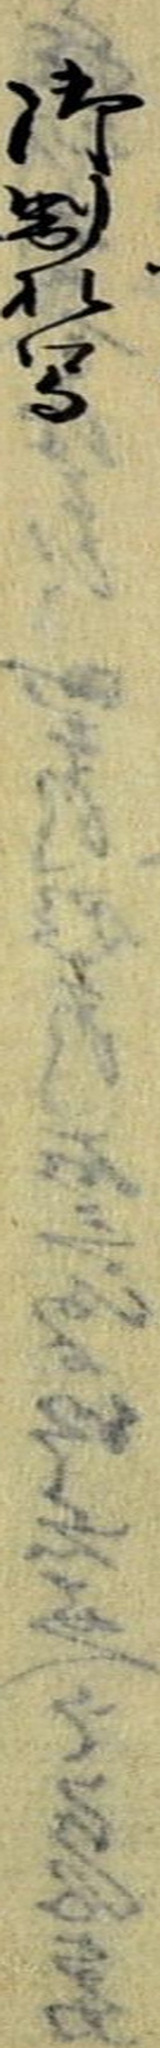御制札写
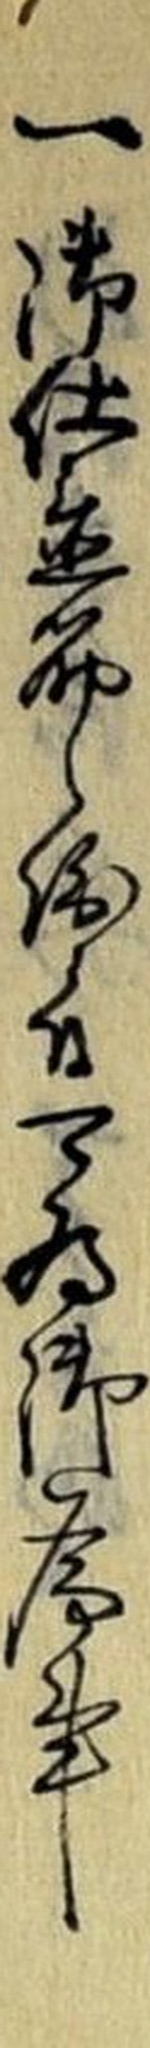一御仕置筋之儀ニ付可為御為事
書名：命令之部 三
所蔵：福井県文書館 Fukui Prefectural Archives
